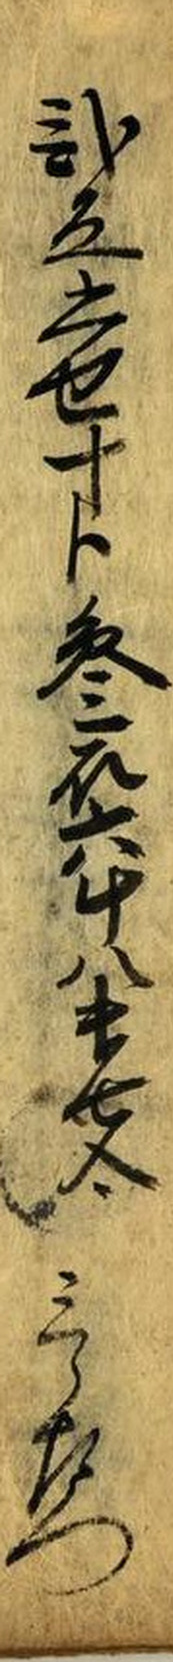同弐反六セ十分参石六斗八升七合三郎左衛門
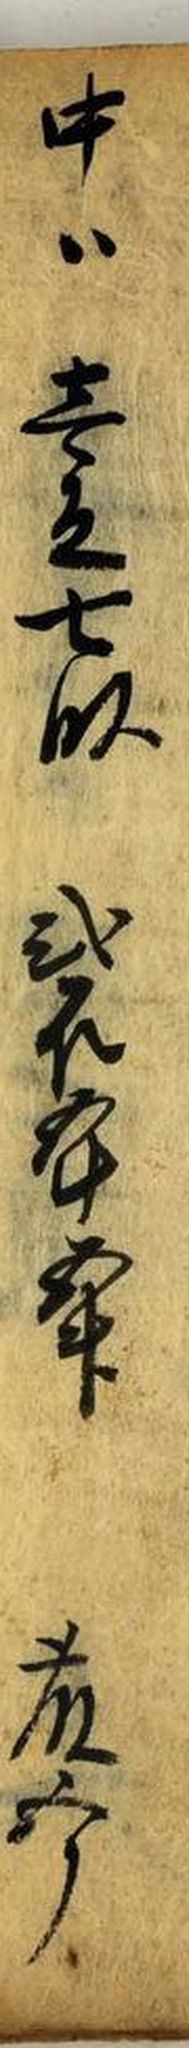中同壱反七畝弐石五斗五升藤五郎
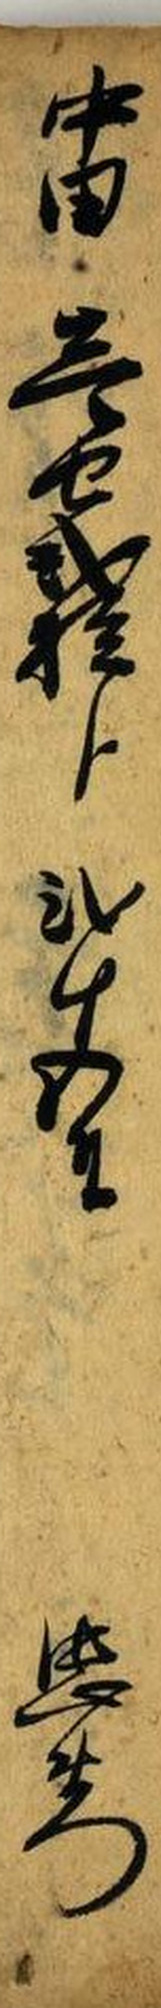中田壱セ弐拾分弐斗五升忠右衛門
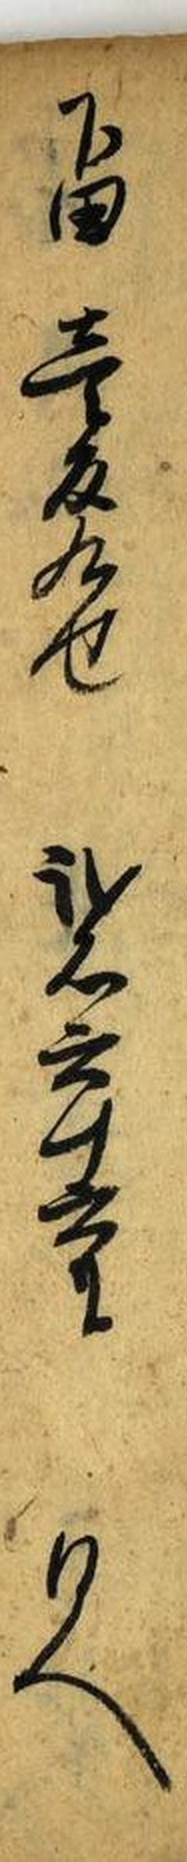下田壱反九セ弐石六斗六升同人
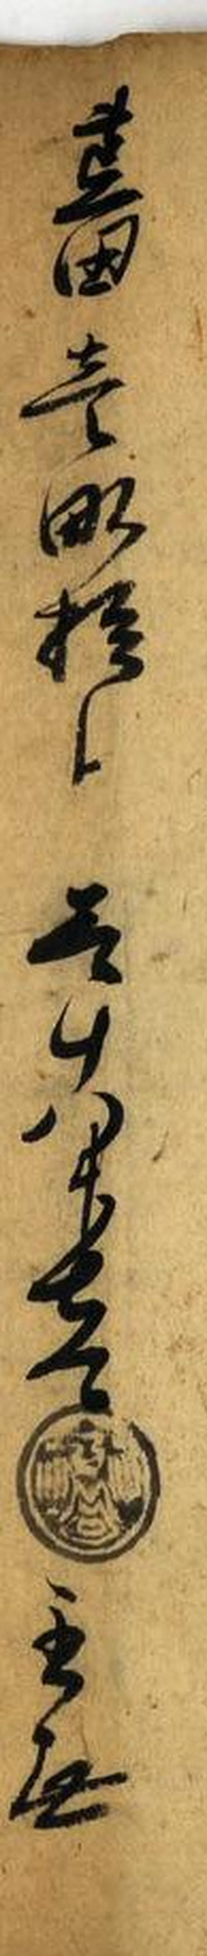荒田壱畝拾分壱斗八升七合㊞主無
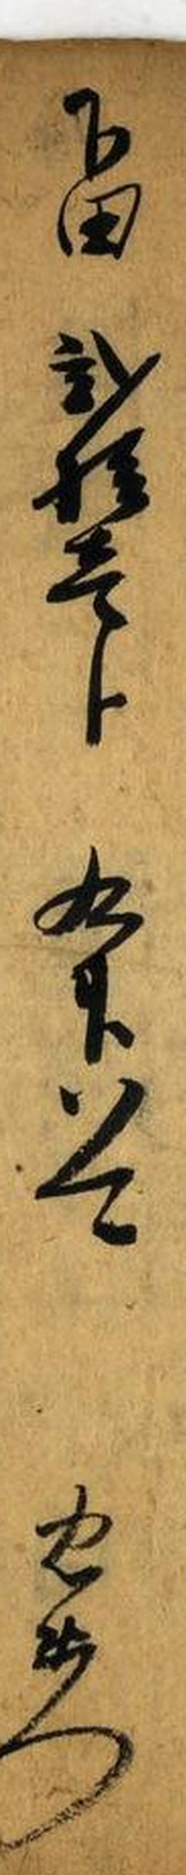下田弐拾壱分九升八合忠右衛門
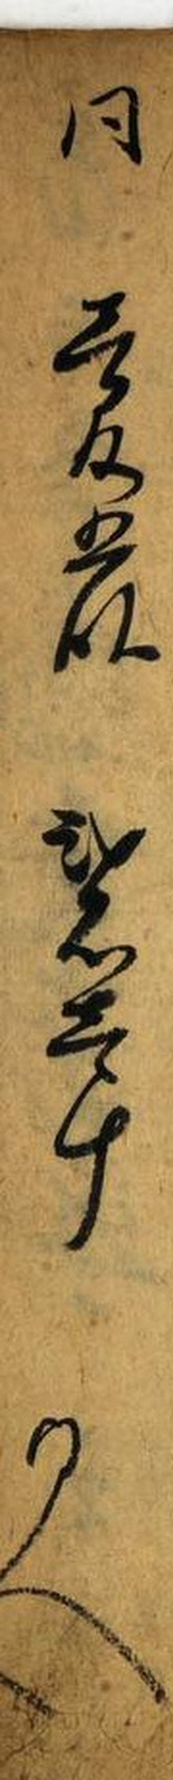同壱反五畝弐石壱斗同人
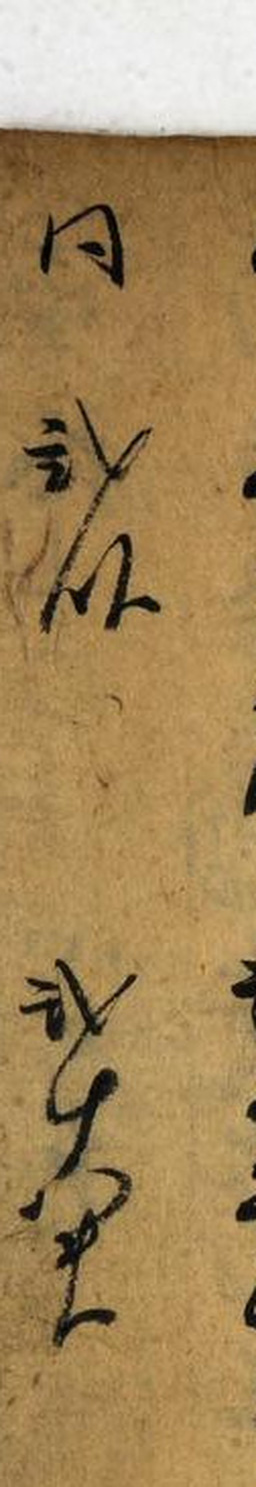同弐畝弐斗八升同人
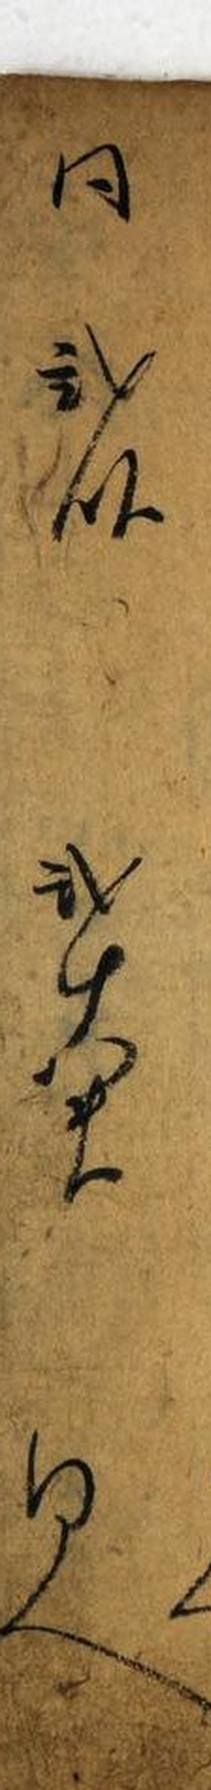同弐畝弐斗八升同人

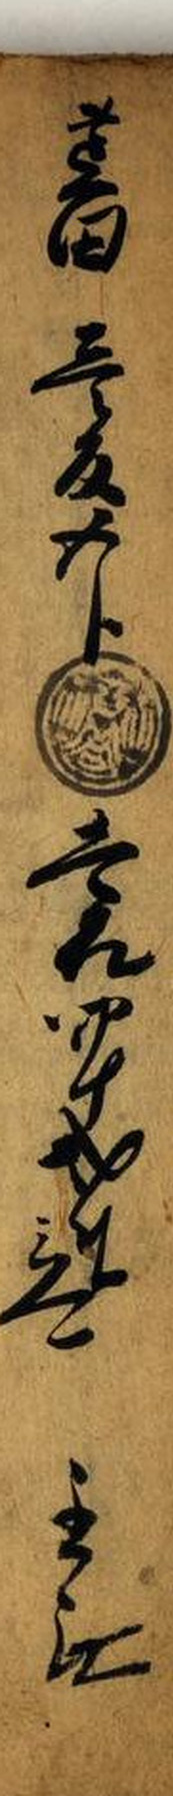荒田壱反五分㊞壱石四斗弐升三合主無
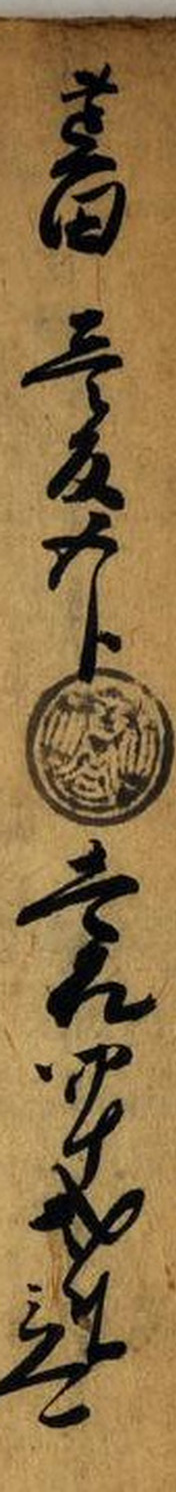荒田壱反五分㊞壱石四斗弐升三合主無
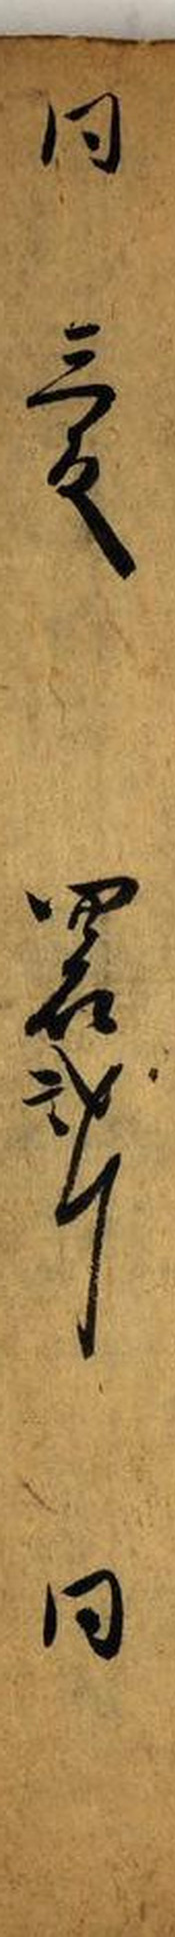同三反四石弐斗同
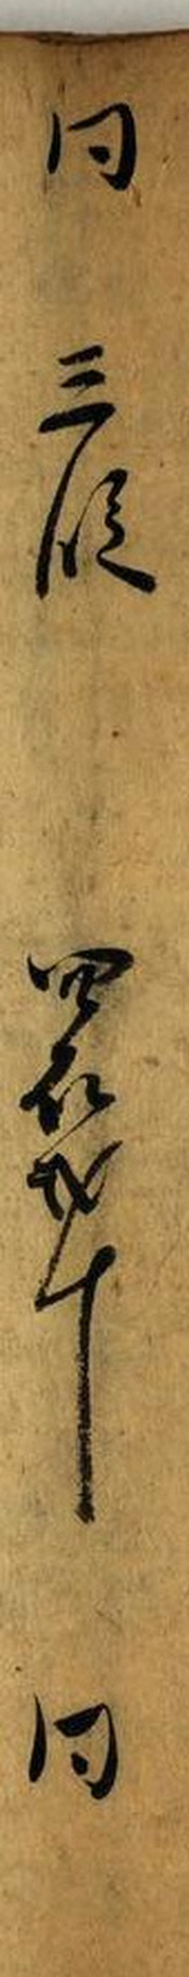同三段四石弐斗同
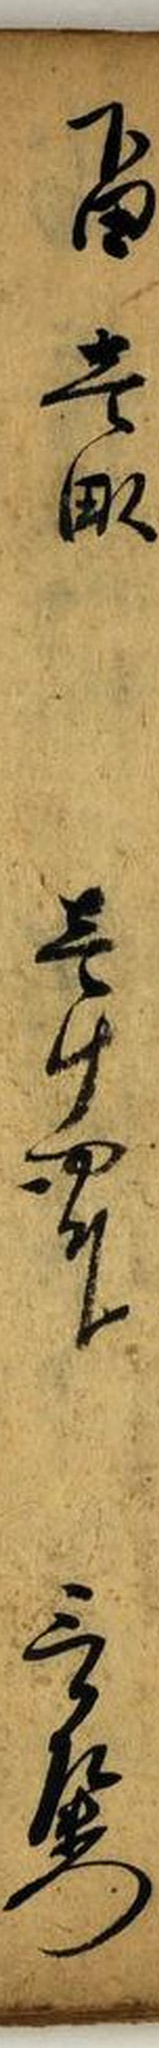下田壱畝壱斗四升三郎左衛門
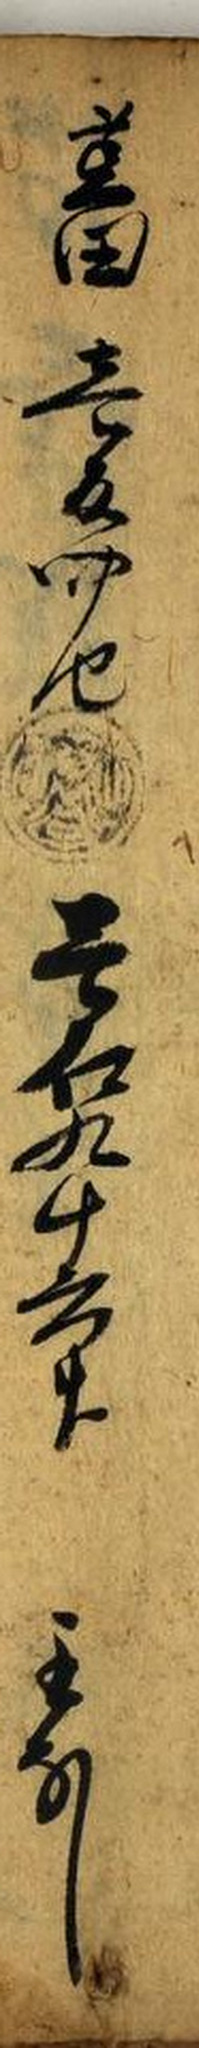荒田壱反四セ㊞壱石九斗六升主なし
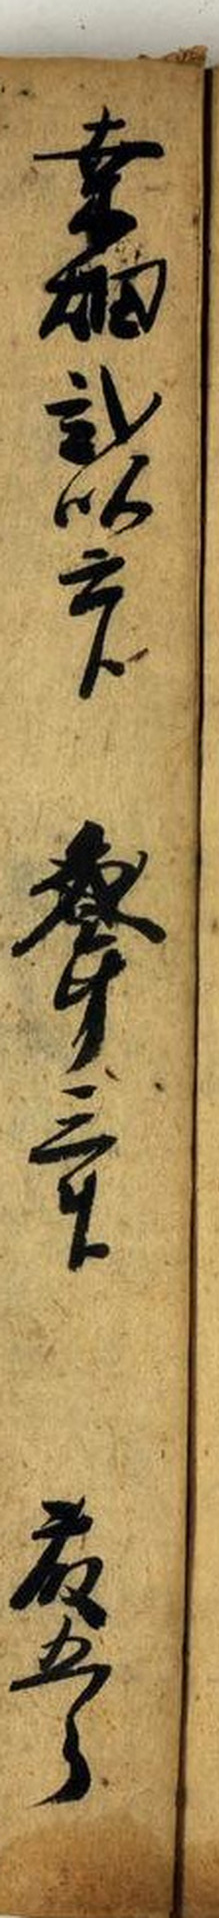桑畑弐畝六分参斗三升藤五郎
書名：越前国西方内志津庄内本折村御検地帳
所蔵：福井県文書館 Fukui Prefectural Archives
